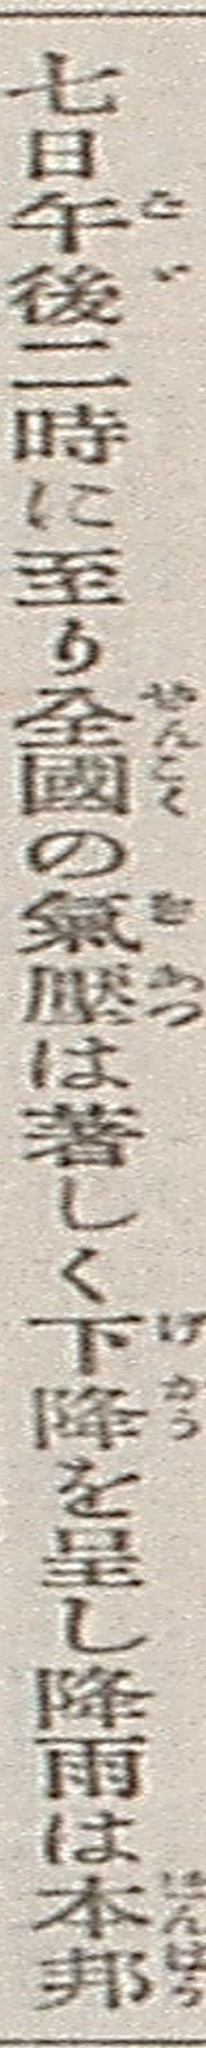七日午後二時に至り全国の気圧は著しく下降を呈し降雨は本邦
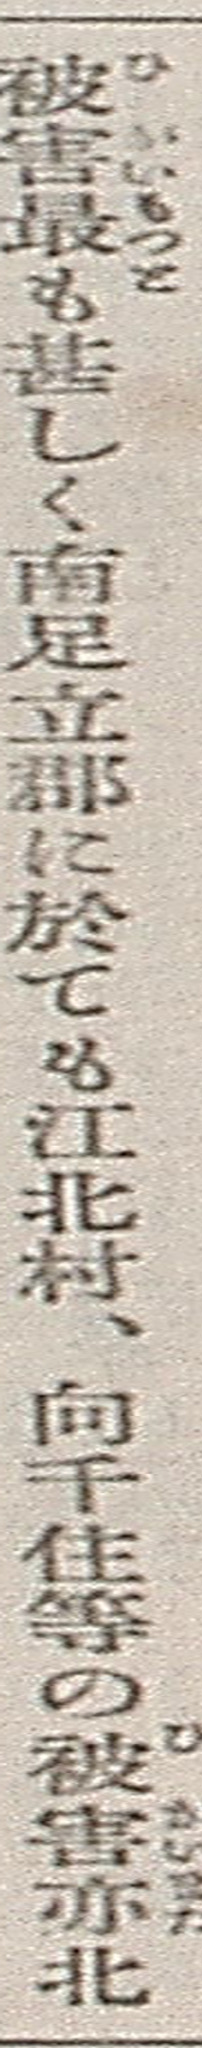被害最も甚しく南足立郡に於ても江北村、向千住等の被害亦北
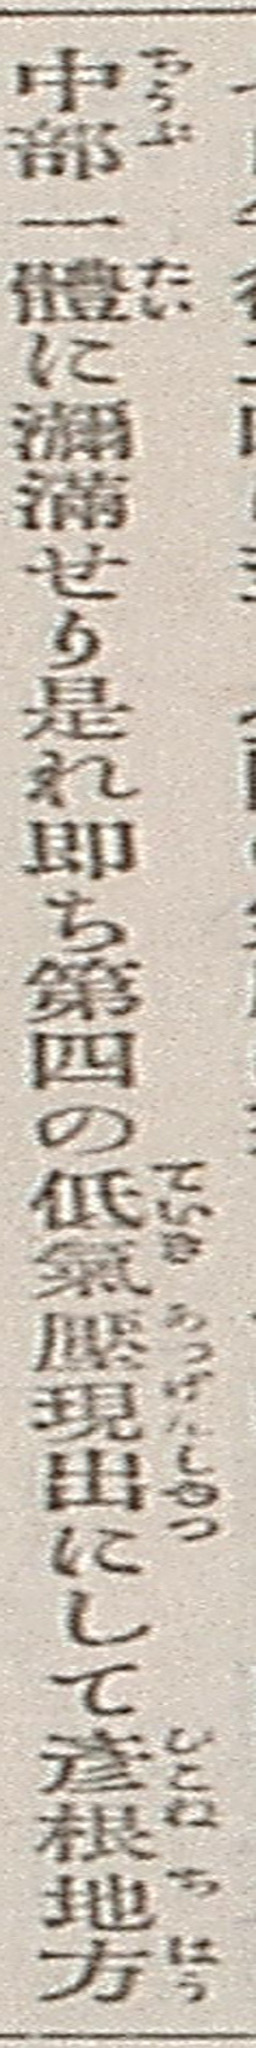中部一体に瀰満せり是れ即ち第四の低気圧現出にして彦根地方
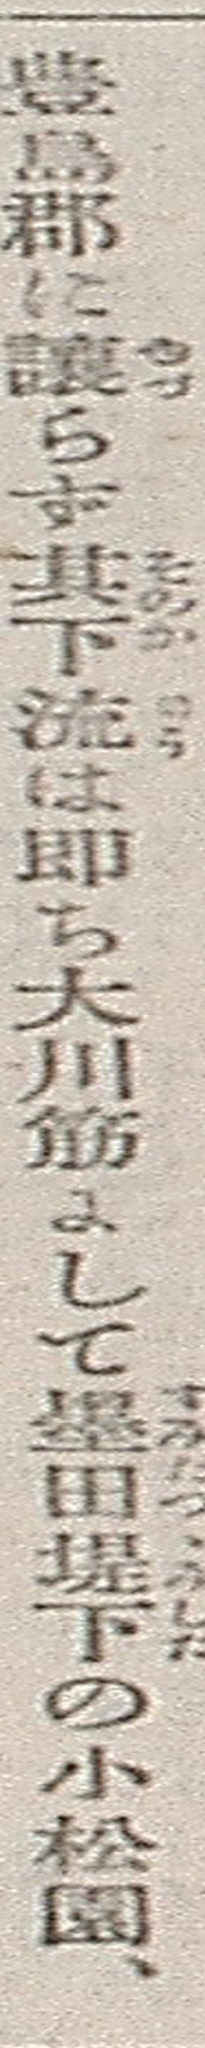豊島郡に譲らず其下流は即ち大川筋にして墨田堤下の小松園、
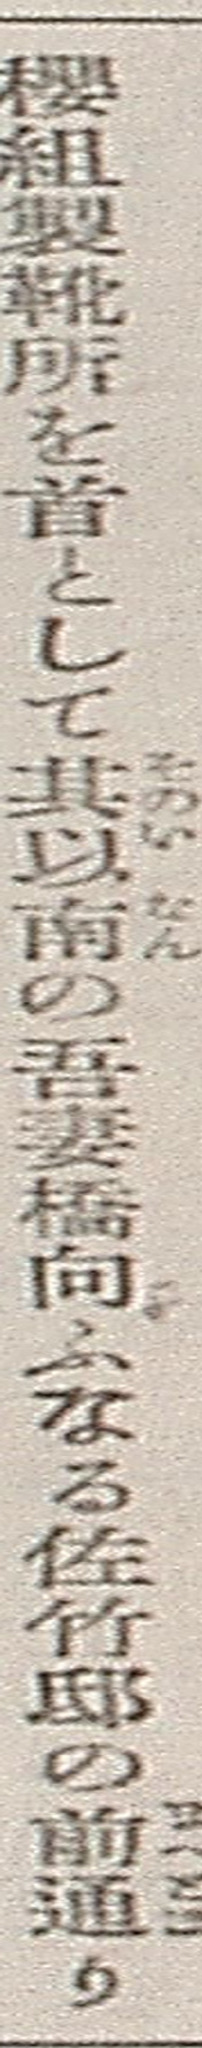桜組製靴所を首として其以南の吾妻橋向ふなる佐竹邸の前通り
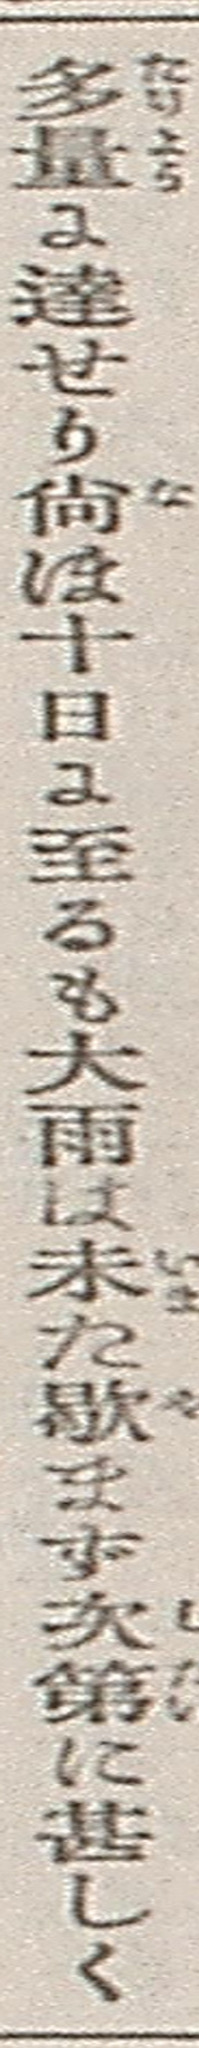多量に達せり尚ほ十日に至るも大雨は未た歇まず次第に甚しく
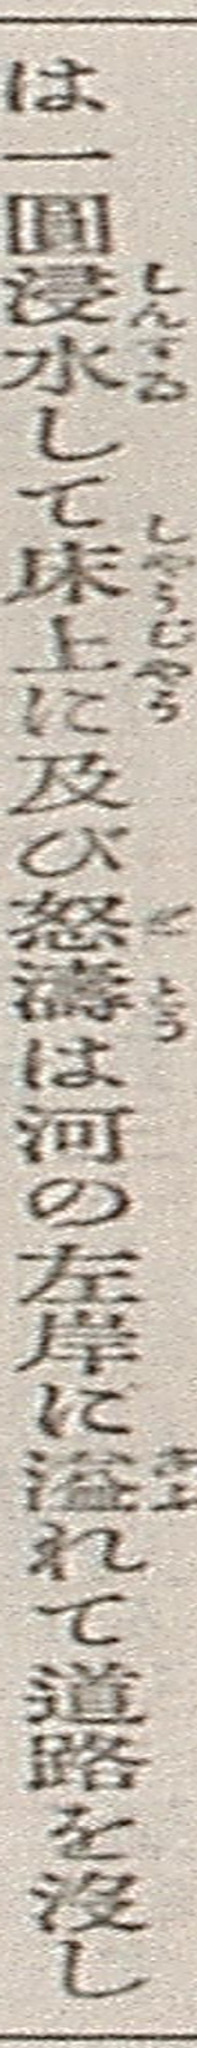は一円浸水して床上に及び怒濤は河の左岸に溢れて道路を没し
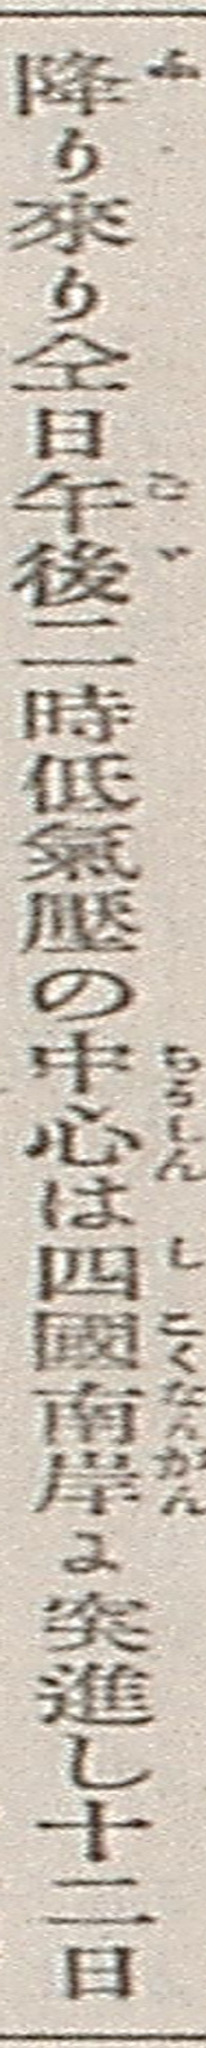降り来り仝日午後二時低気圧の中心は四国南岸に突進し十二日
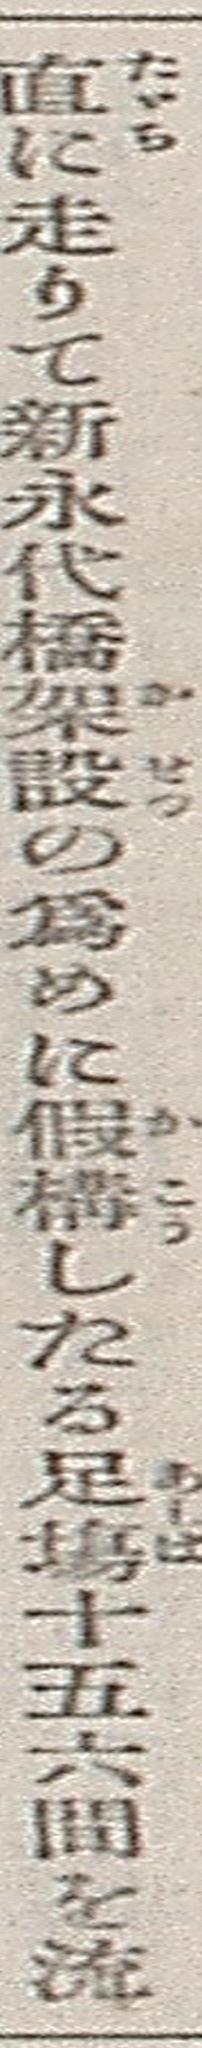直に走りて新永代橋架設の為めに仮構したる足場十五六間を流
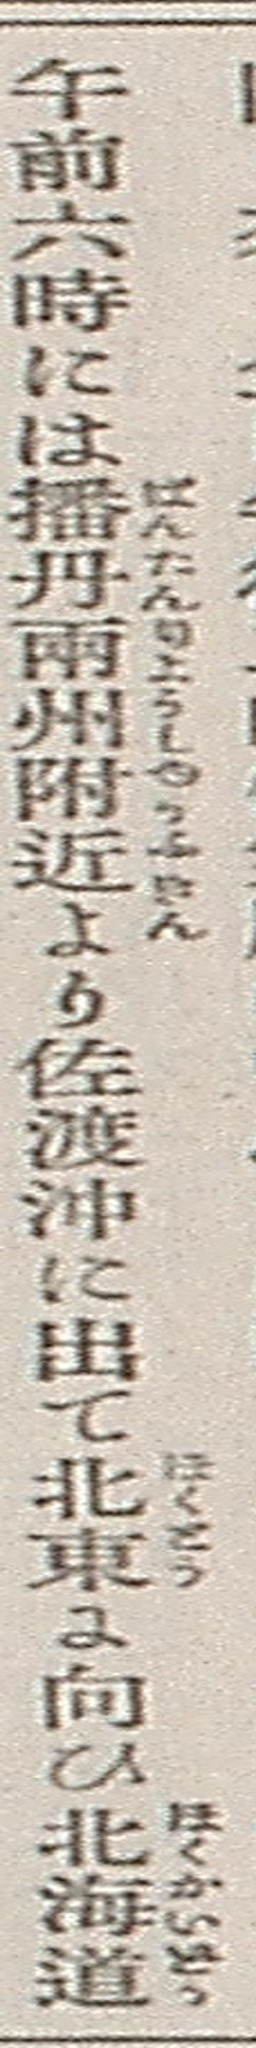午前六時には播丹両州附近より佐渡沖に出て北東に向ひ北海道
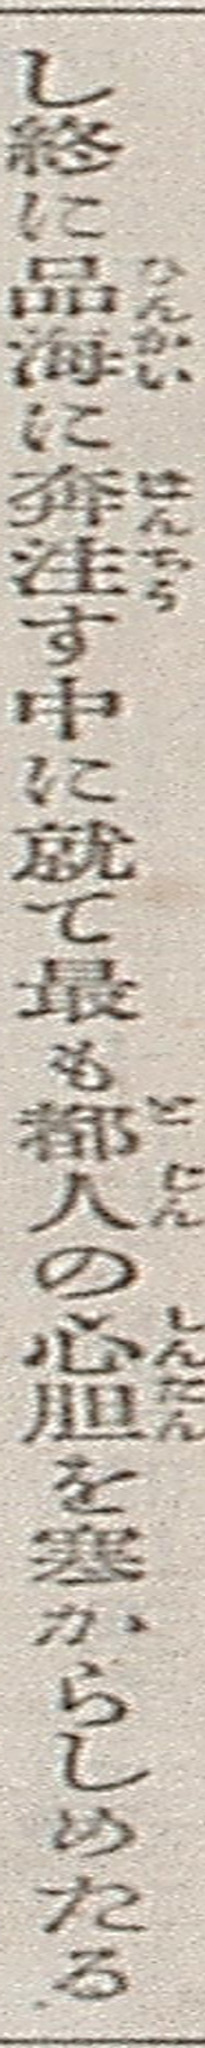し終に品海に奔注す中に就て最も都人の心胆を寒からしめたる
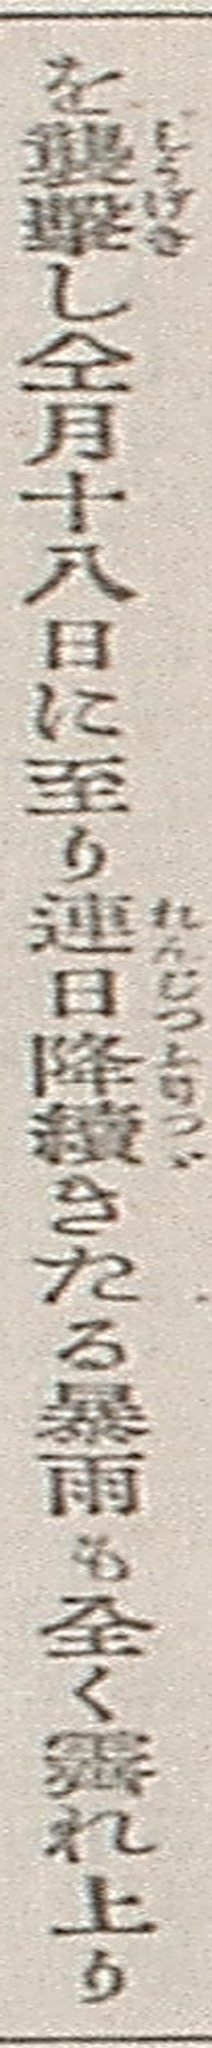を襲撃し仝月十八日に至り連日降続きたる暴雨も全く霽れ上り
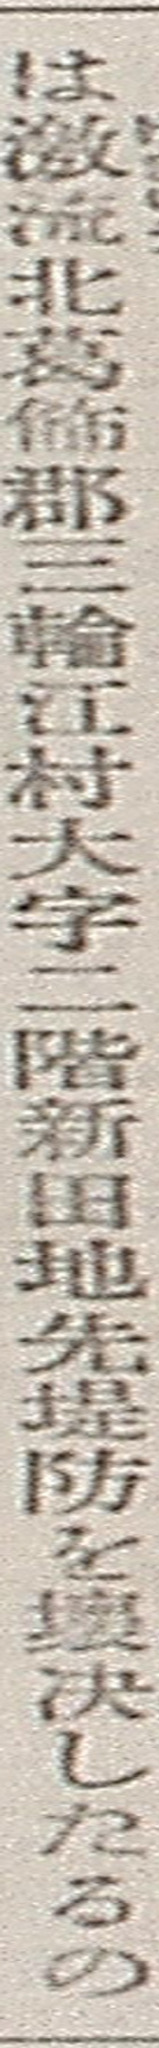は激流北葛飾郡三輪江村大字二階新田地先堤防を壊決したるの

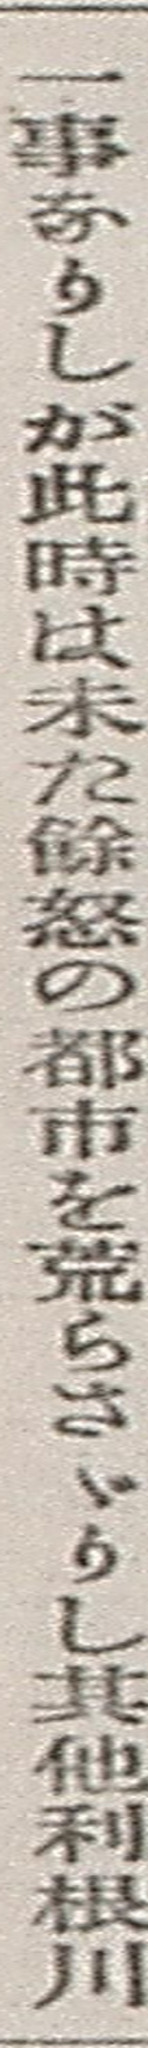一事なりしが此時は未た余怒の都市を荒らさゞりし其他利根川
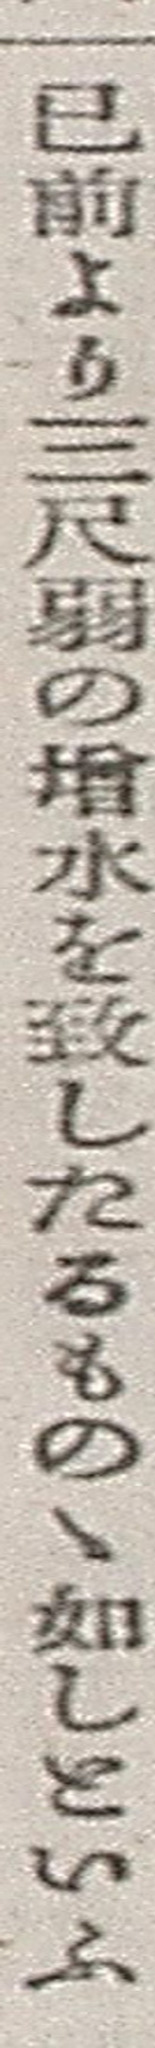已前より三尺弱の増水を致したるものゝ如しといふ
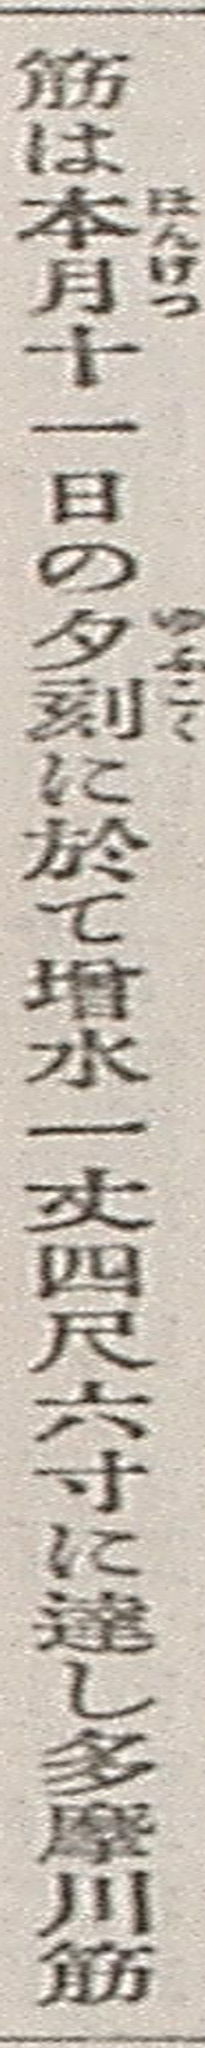筋は本月十一日の夕刻に於て増水一丈四尺六寸に達し多摩川筋
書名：風俗畫報臨時増刊第百二十四號　洪水地震被害録（上）
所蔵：東京大学地震研究所図書室 Earthquake Research Institute Library, The University of Tokyo, JAPAN
